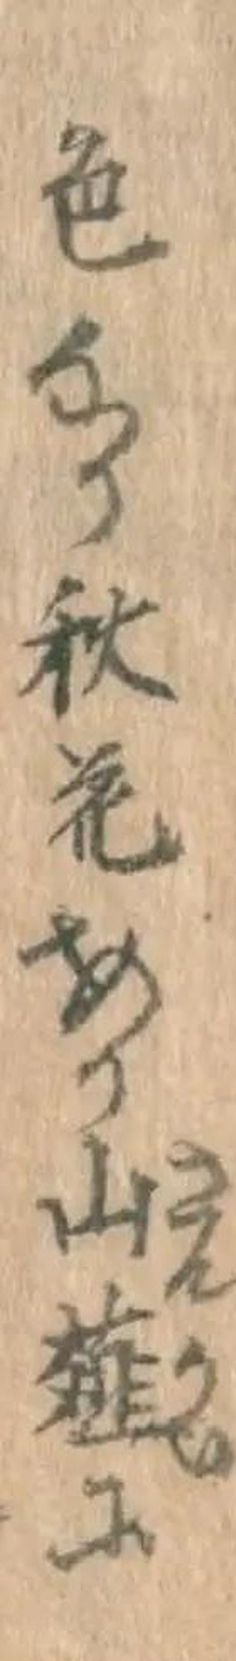色なり秋花あり山薤に
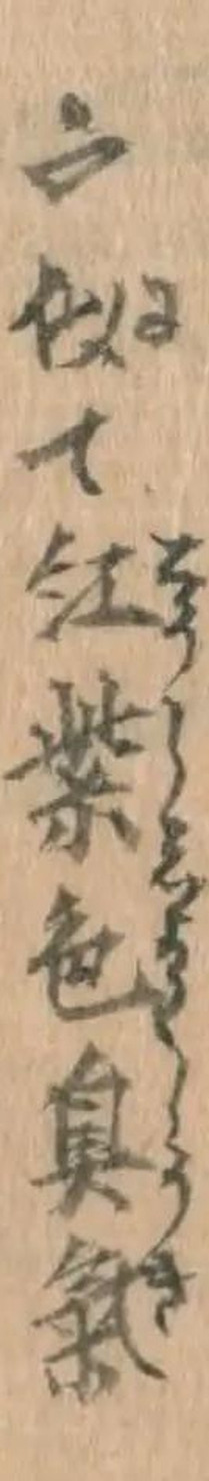・▻似て紅紫色臭気
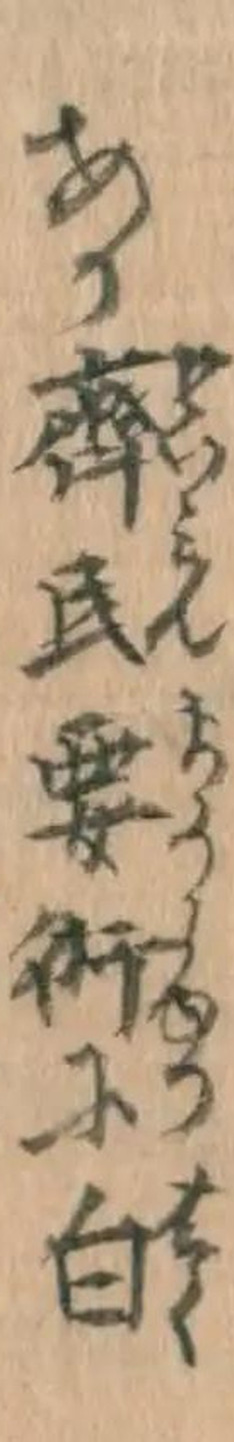あり斉民要術に白
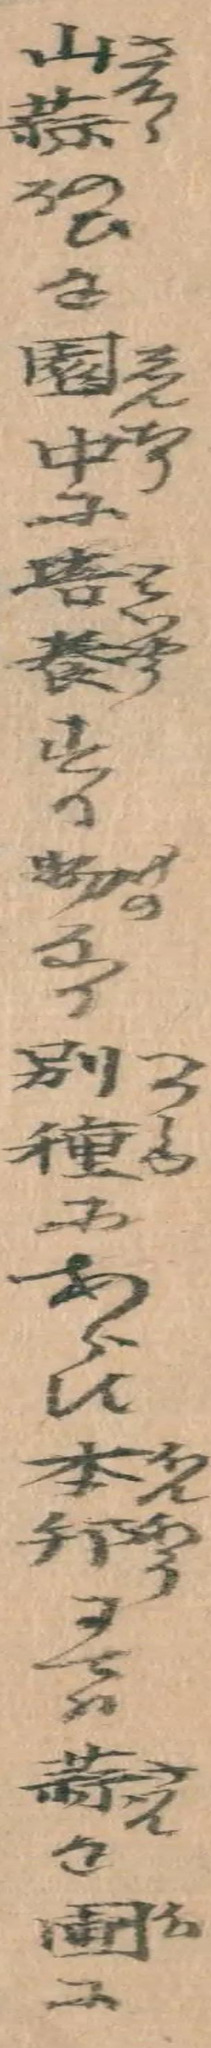山蒜のひるを園中に培養する物なり別種にあらす本邦にては蒜を圃に
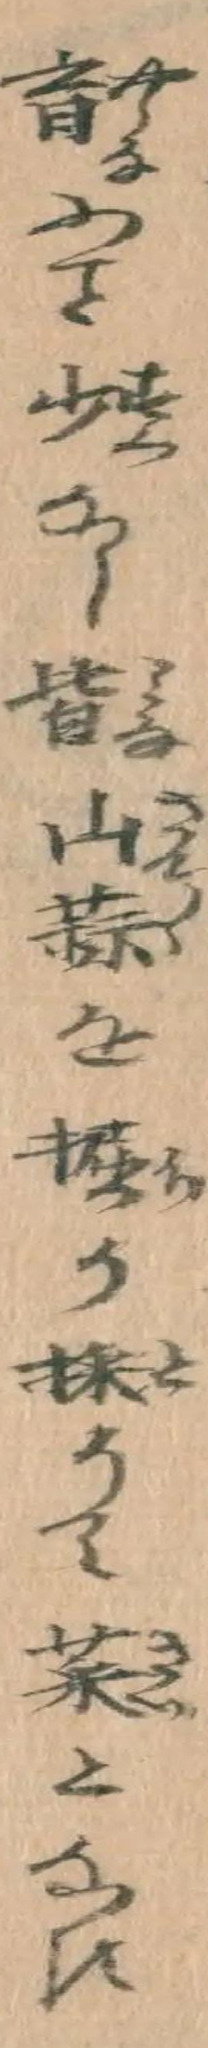育ふこと少なし皆山蒜を堀り採りて菜となす
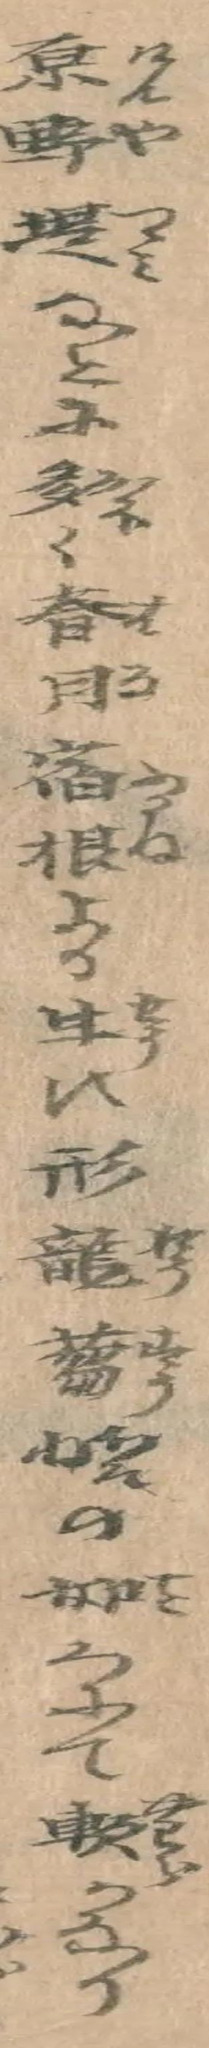原野堤なとに多く春月宿根より生す形竜芻ほそねの如くにて軟かなり
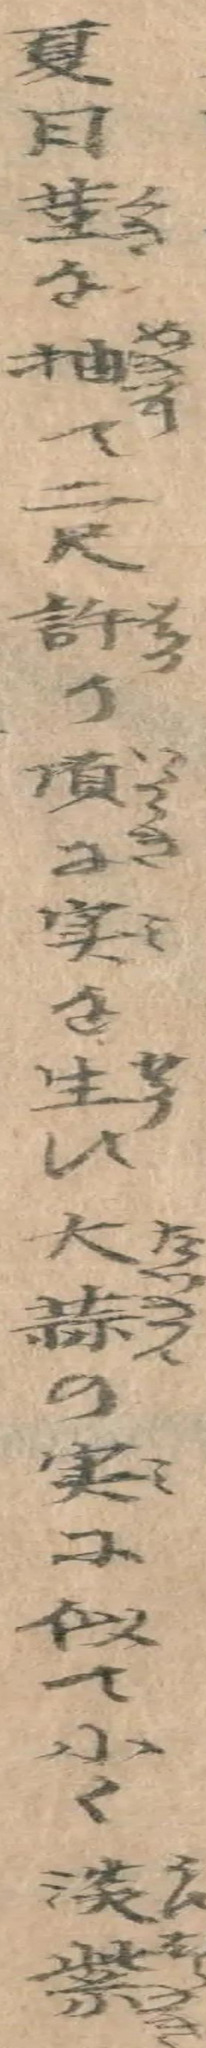夏月茎を抽て二尺許り頂に実を生す大蒜の実に似て小く淡紫
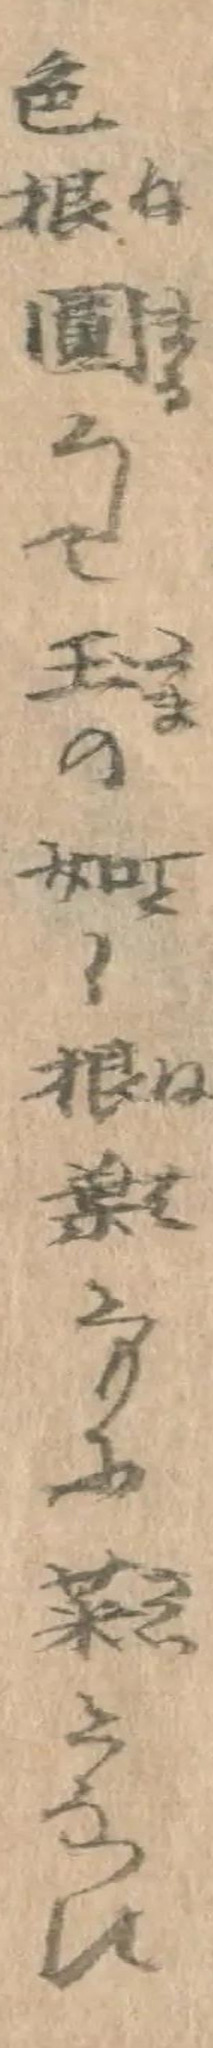色根円くして玉の如し根葉ともに菜となす

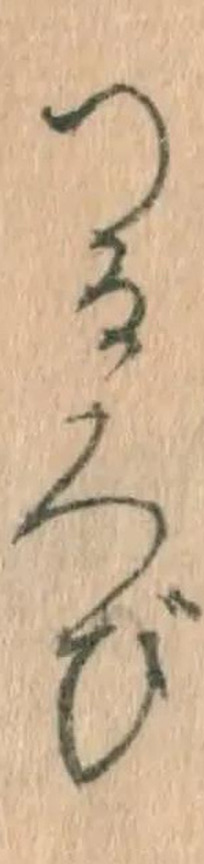つるくび
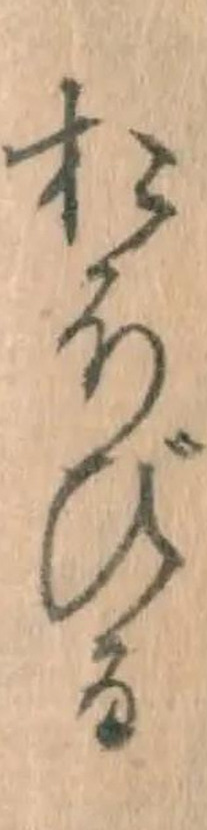おほびる

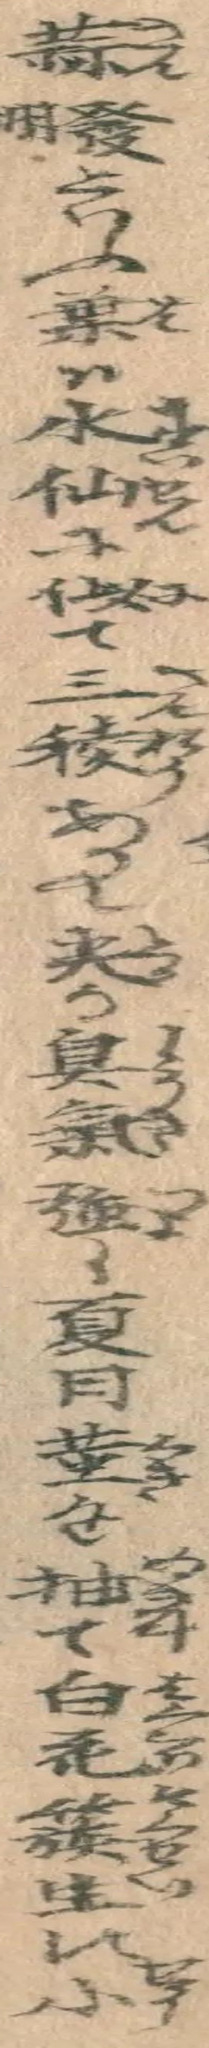蒜発明をいふ葉は水仙に似て三稜ありて尖り臭気強し夏月茎を抽て白花簇生す小
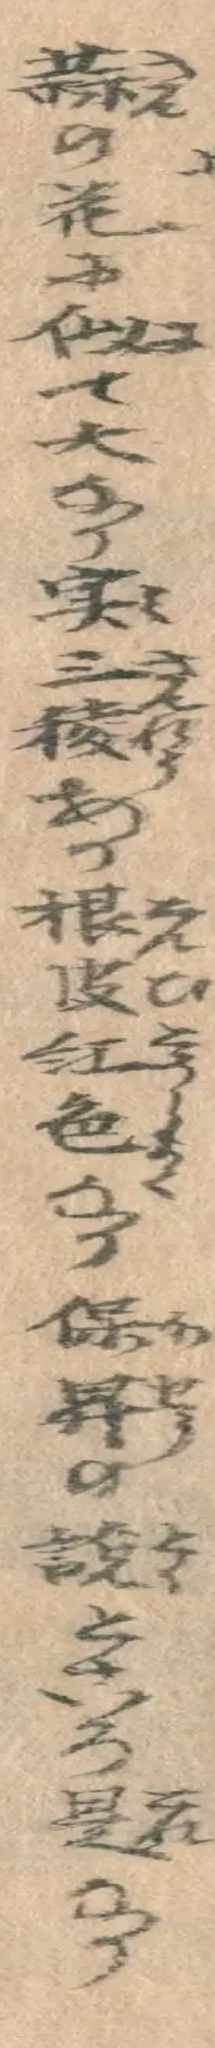蒜の花に似て大なり実三稜あり根皮紅色なり保昇の説ところ是なり
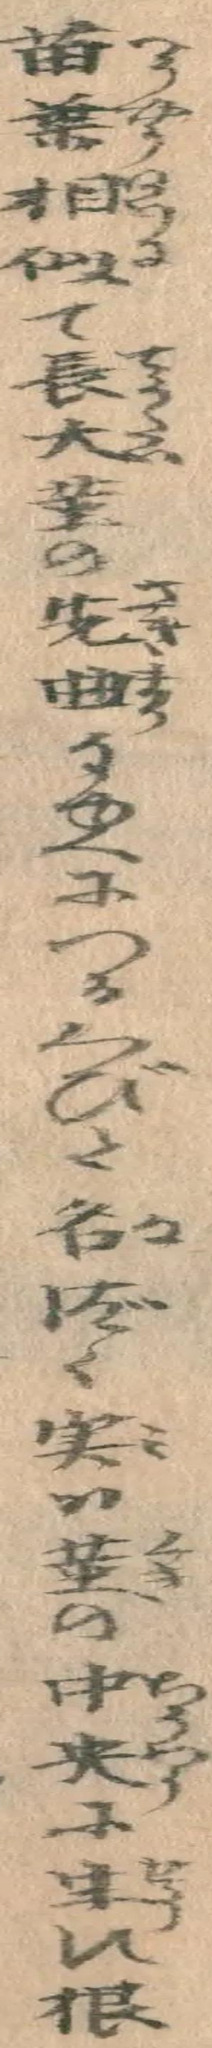苗葉相似て長大茎の先曲るゆへにつるくびと名づく実は茎の中央に生す根
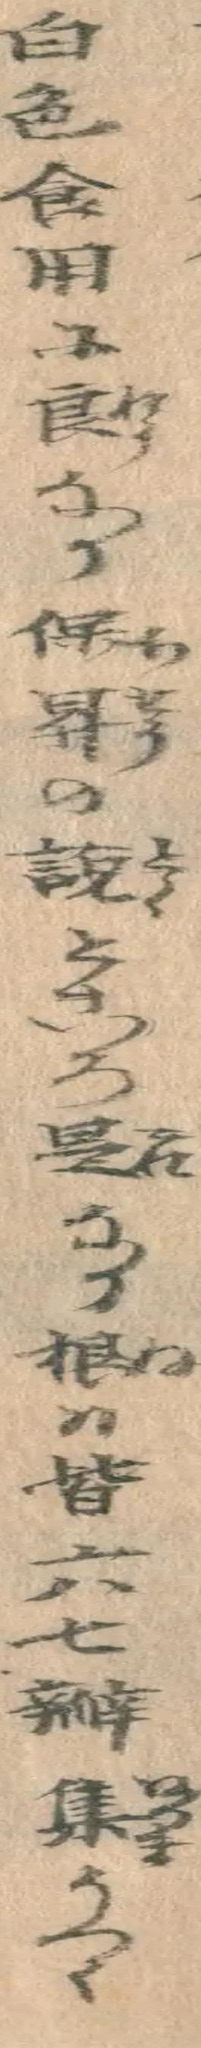白色食用に良なり保昇の説ところ是なり根は皆六七弁集りつく
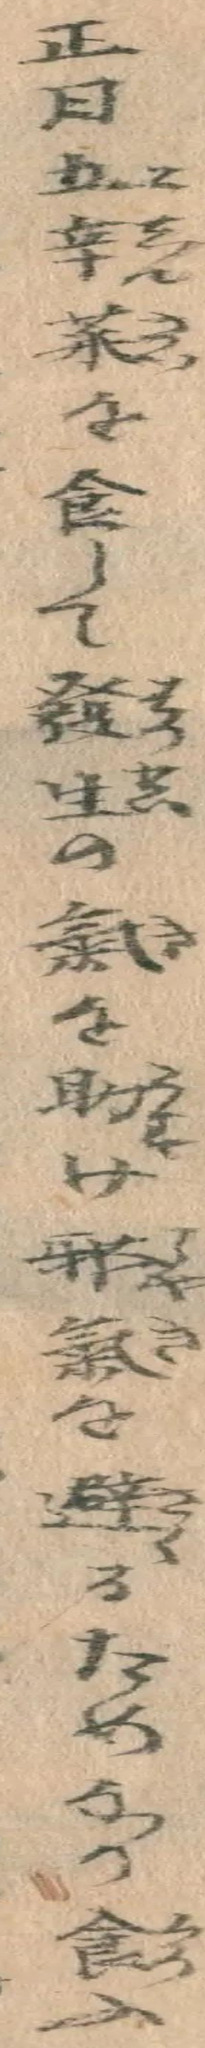正月五辛菜を食して発生の気を助け邪気を避るためなり食ふ
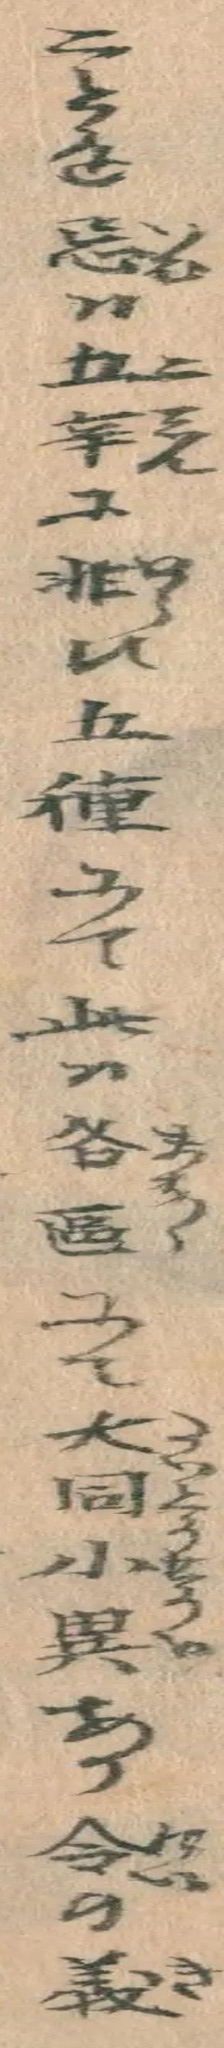ことを忌は五辛に非す五種にて此は各区にて大同小異あり令の義
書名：本草図譜. 巻43-45
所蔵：国立国会図書館 National Diet Library, JAPAN
